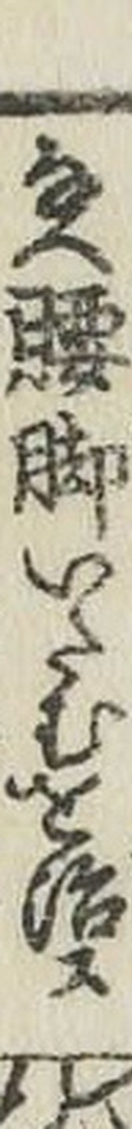なへ腰脚いたむを治す
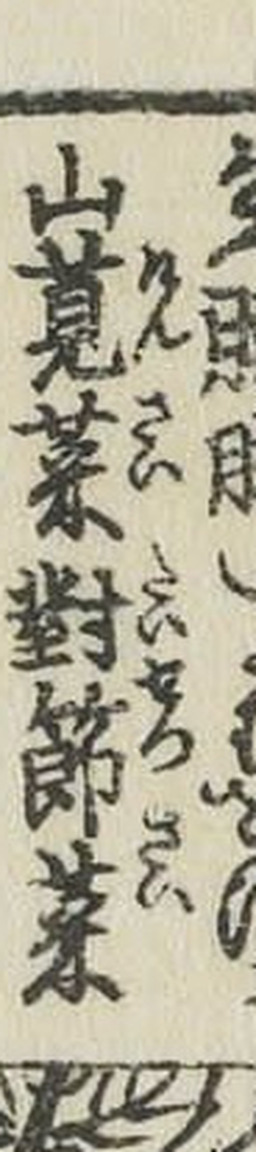山莧菜対節菜
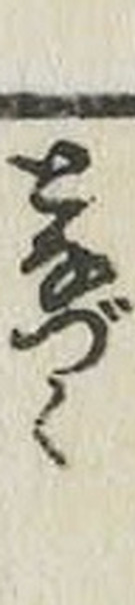となづく
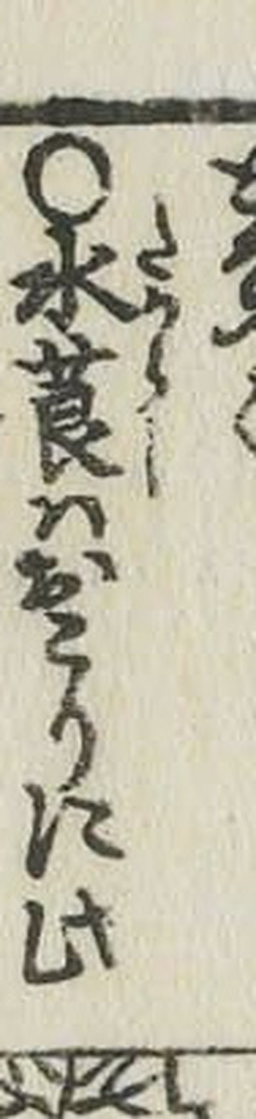○水莨はおこりに此
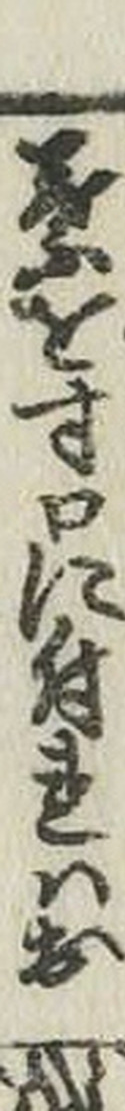葉を寸口に付れはお
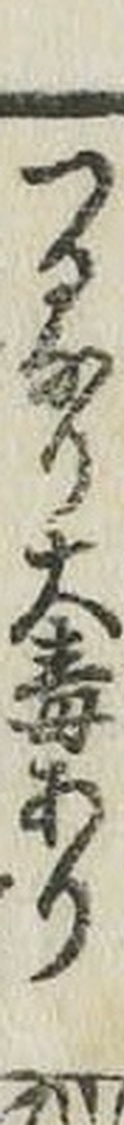つるなり大毒あり
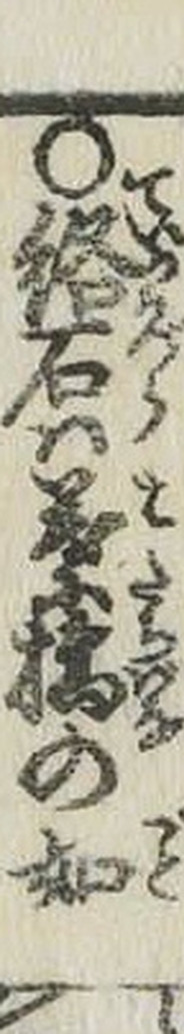○絡石は葉橘の如
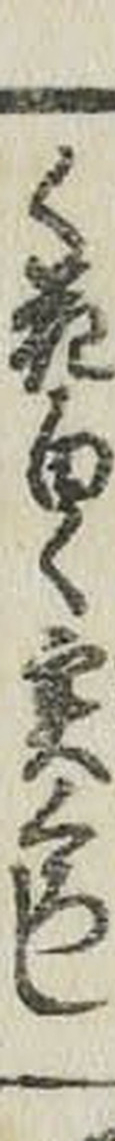く花白く実くろし
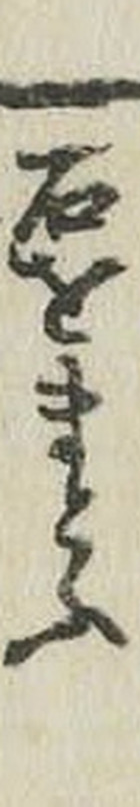石をまとふ
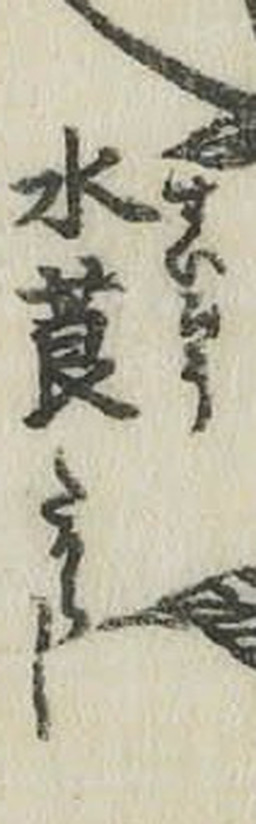水莨たからし

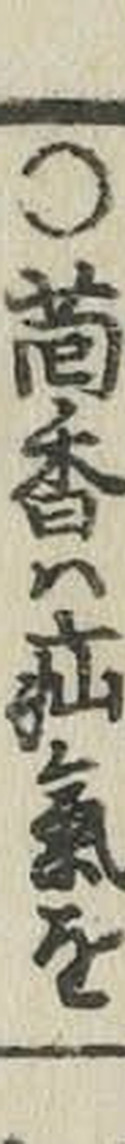○茴香は疝気を
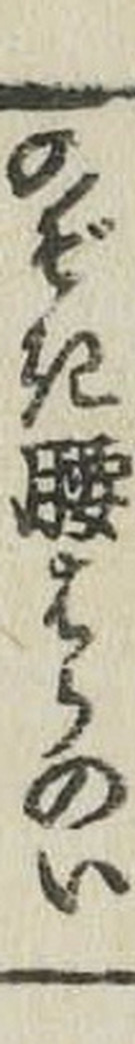のぞき腰はらのい
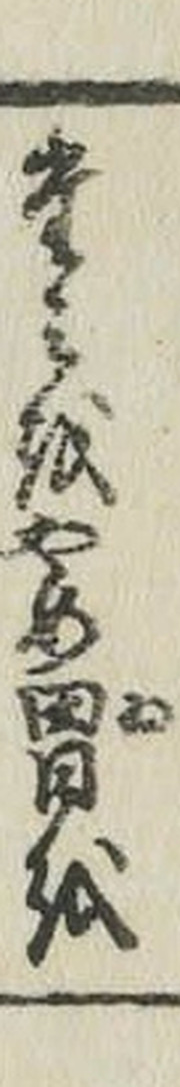たみをやめ胃を
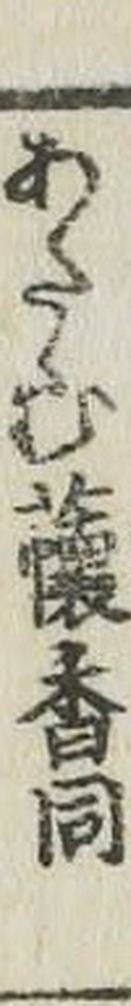あたゝむ蘹香同
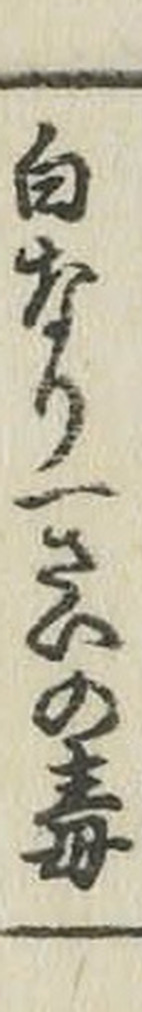白なり一さいの毒
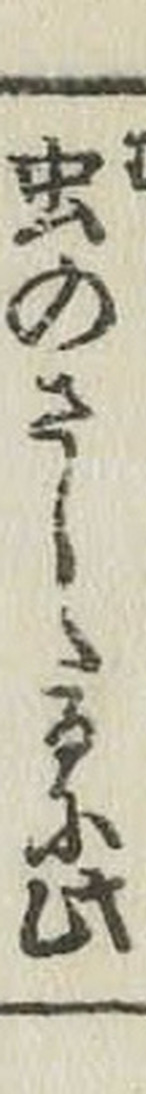虫のさしたるに此
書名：増補頭書訓蒙図彙大成 10巻 9:巻之20
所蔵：東京学芸大学教育コンテンツアーカイブ
